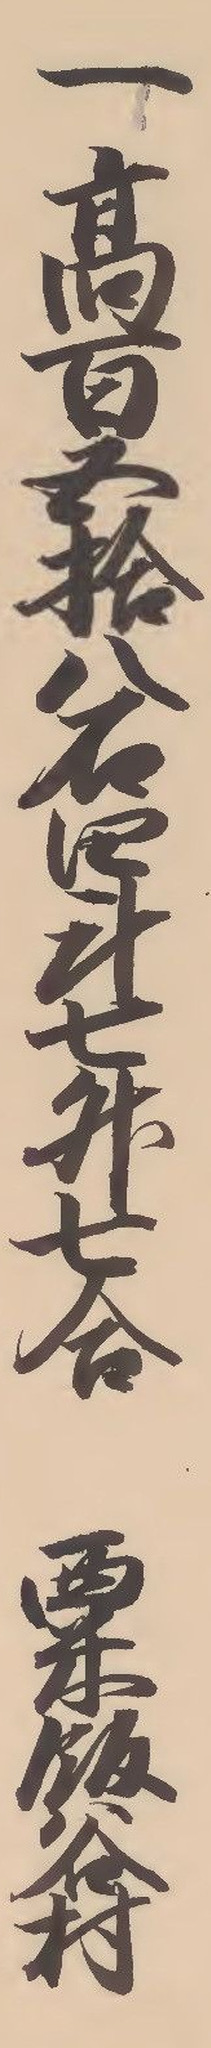一高百五拾八石四斗七升七合粟飯谷村
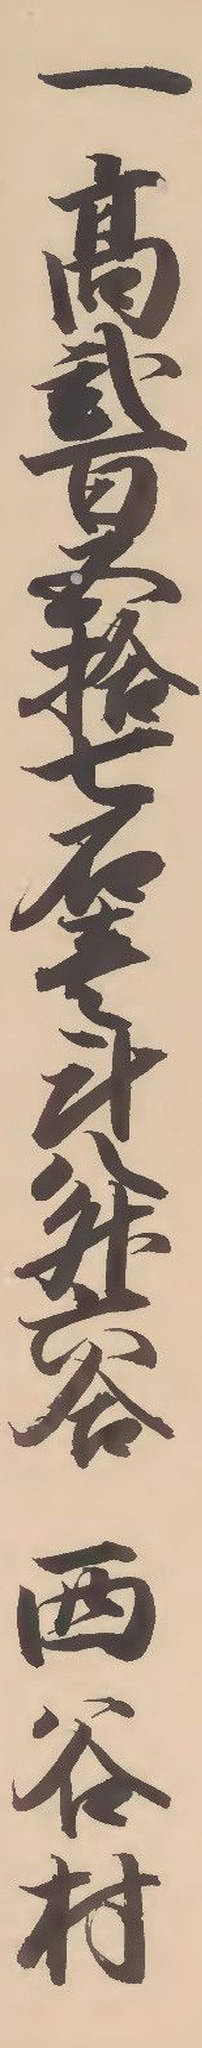一高弐百五拾七石壱斗八升六合西谷村
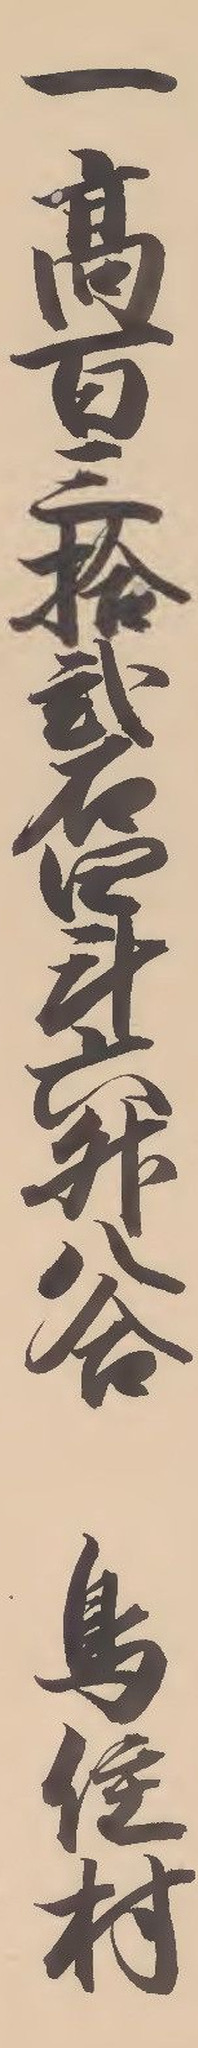一高百三拾弐石四斗六升八合鳥住村
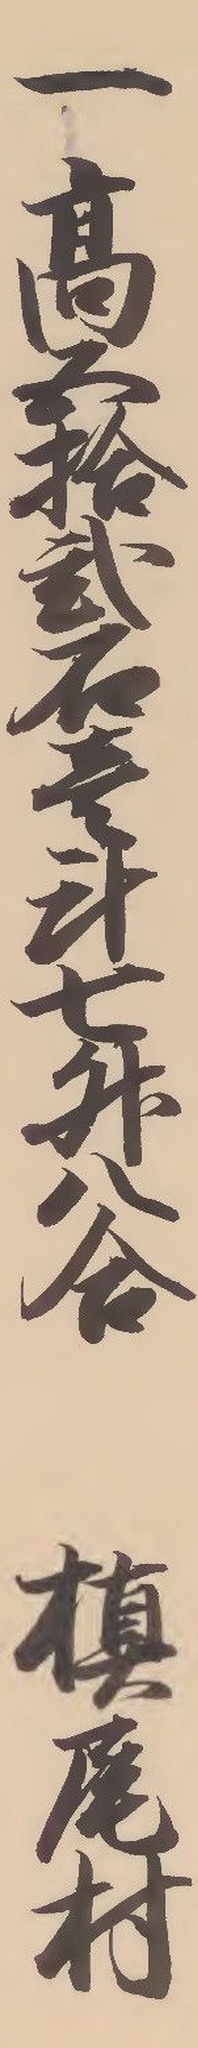一高五拾弐石壱斗七升八合槙尾村
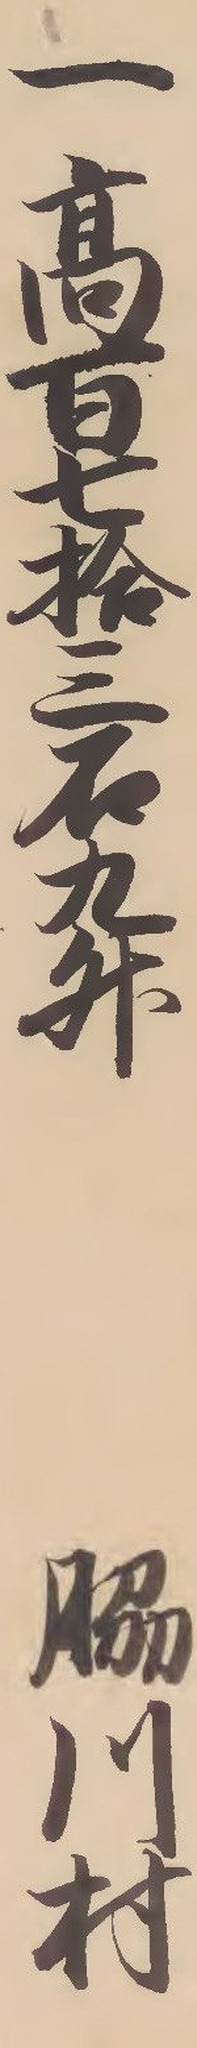一高百七拾三石九升脇川村
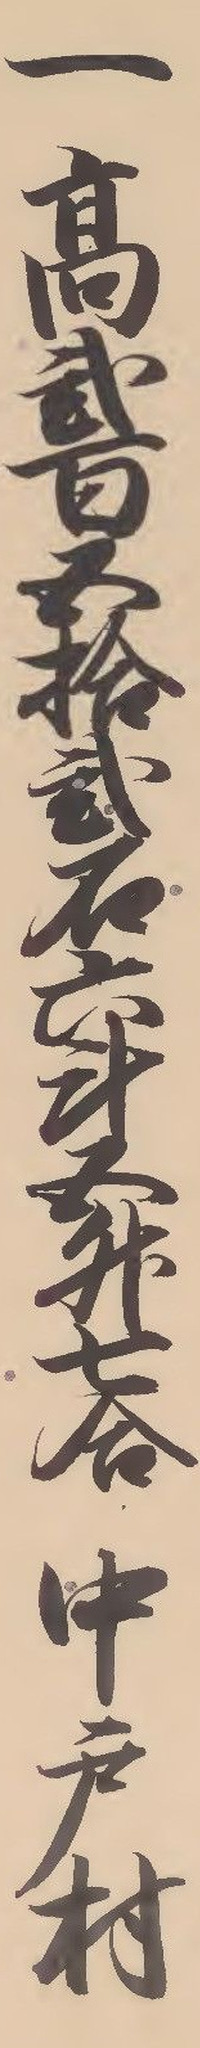一高弐百五拾弐石六斗五升七合中戸村

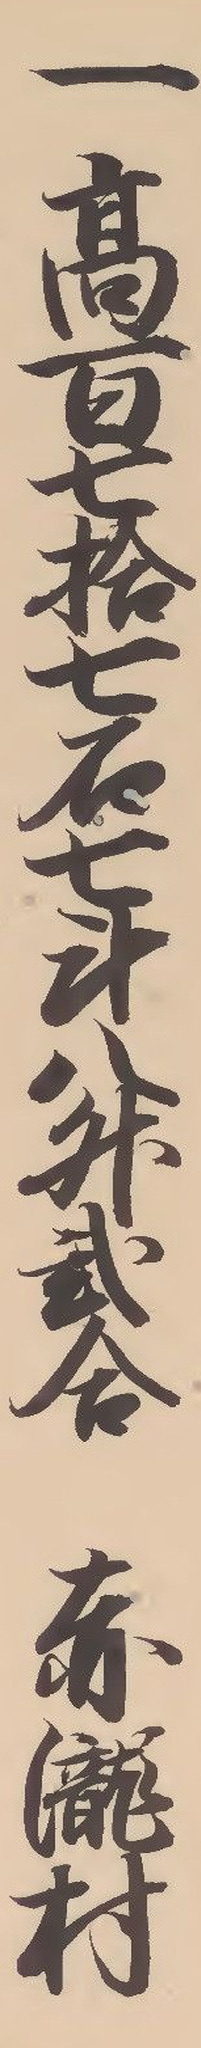一高百七拾七石七斗八升弐合赤滝村
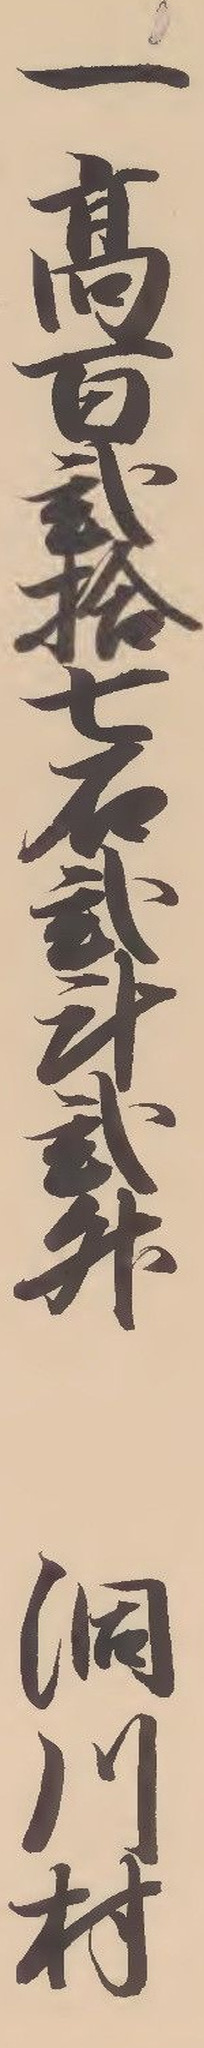一高百弐拾七石弐斗弐升洞川村
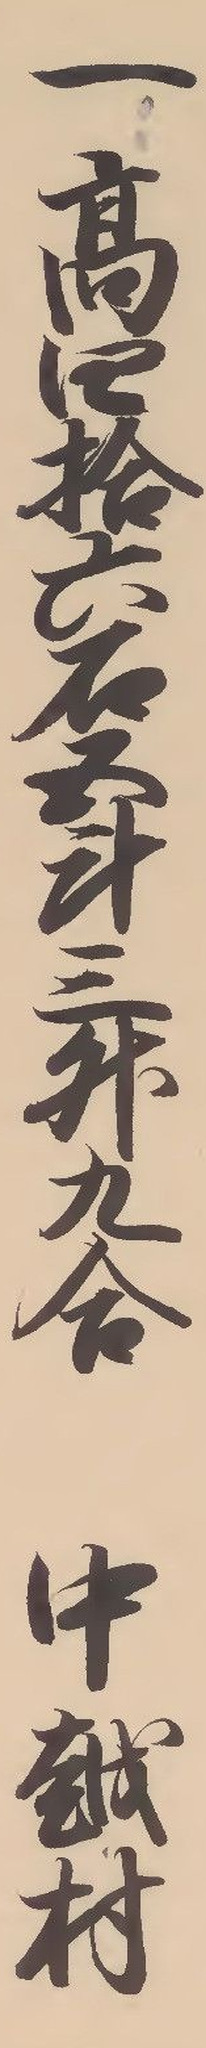一高四拾六石五斗三升九合中越村
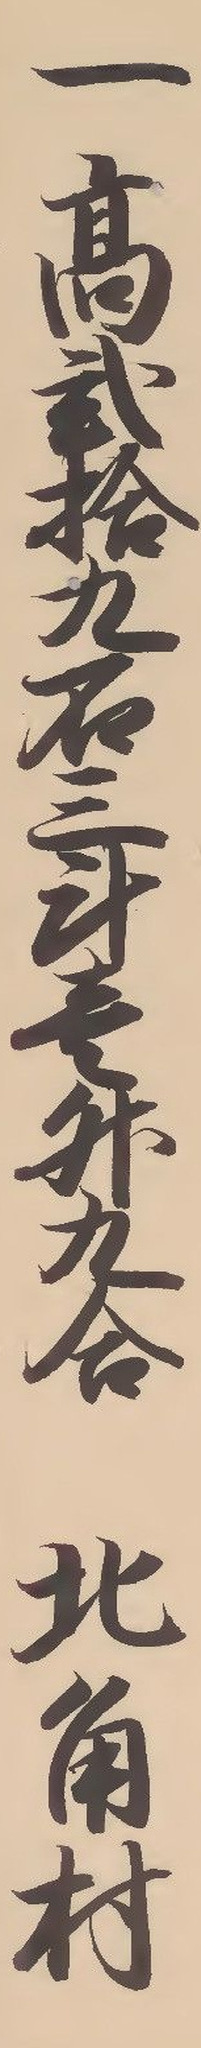一高弐拾九石三斗壱升九合北角村
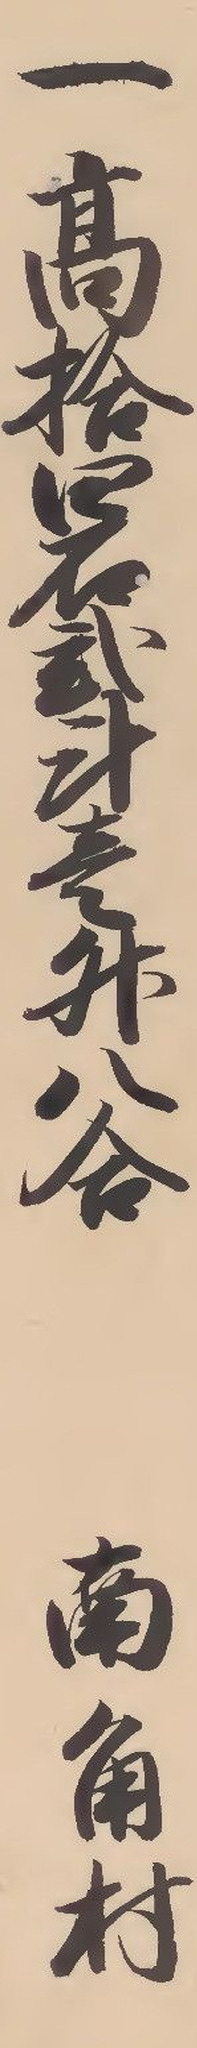一高拾四石弐斗壱升八合南角村
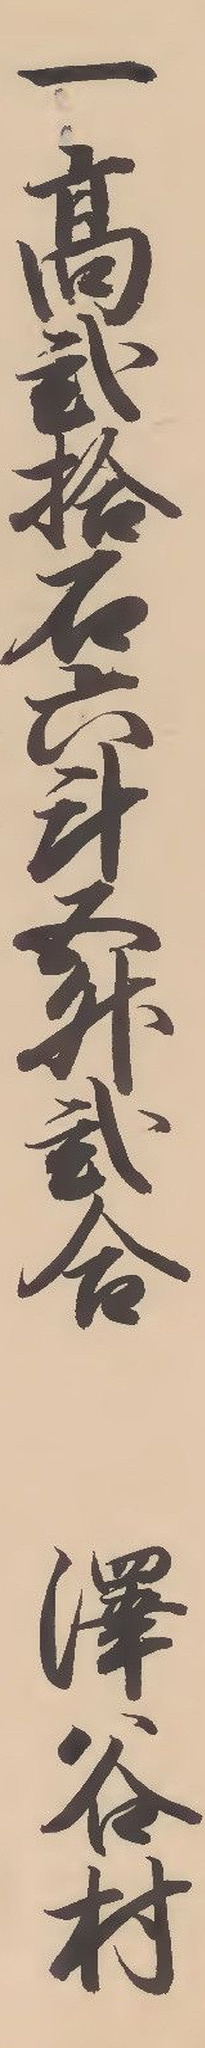一高弐拾石六斗五升弐合沢谷村
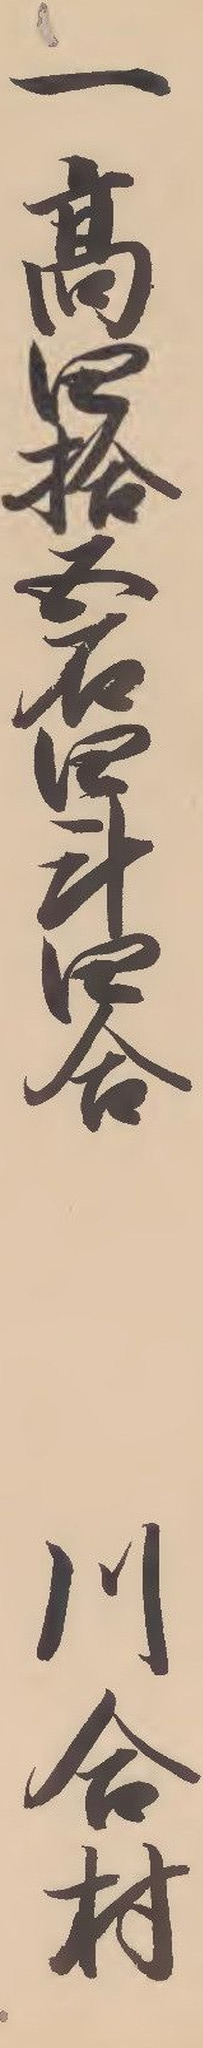一高四拾五石四斗四合川合村
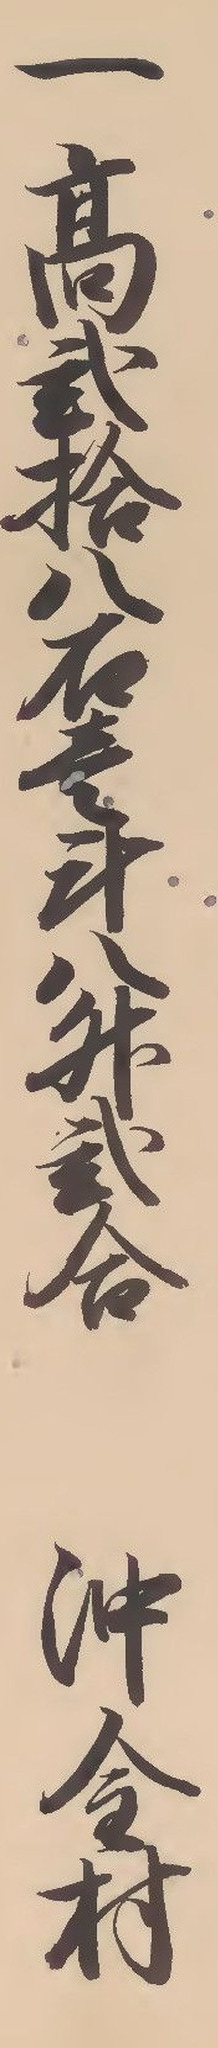一高弐拾八石壱斗八升弐合沖金村

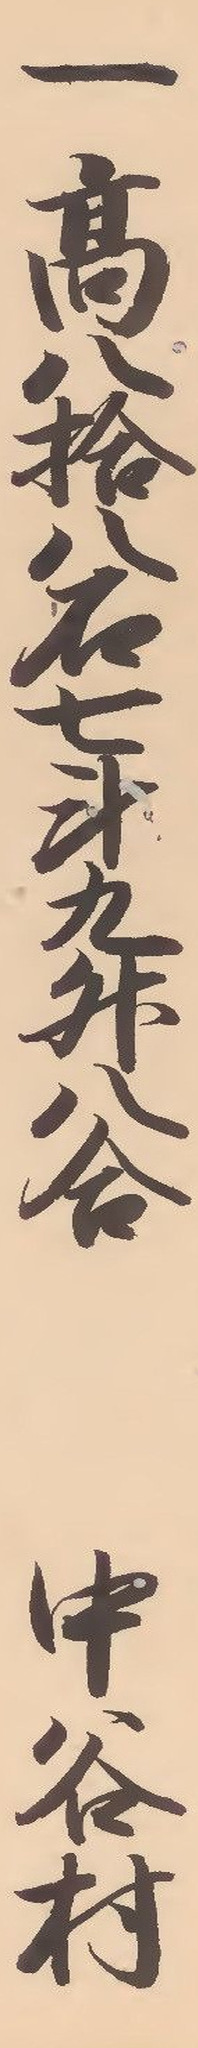一高八拾八石七斗九升八合中谷村
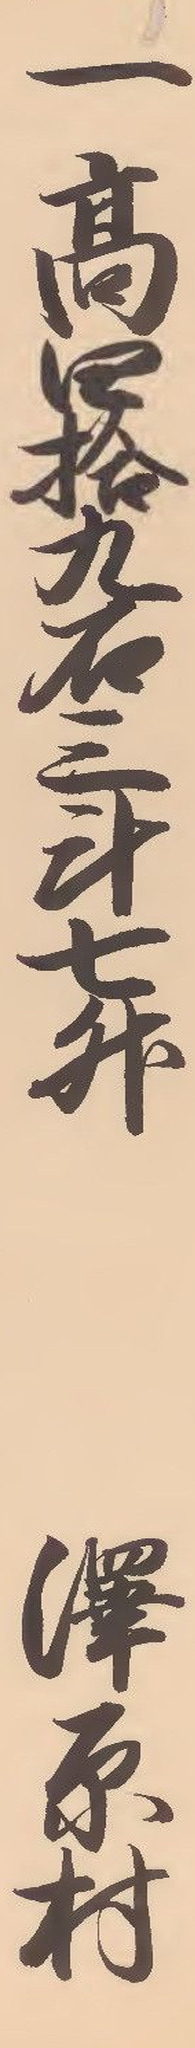一高四拾九石三斗七升沢原村
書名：大和国郷帳
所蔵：国立公文書館 National Archives of Japan
